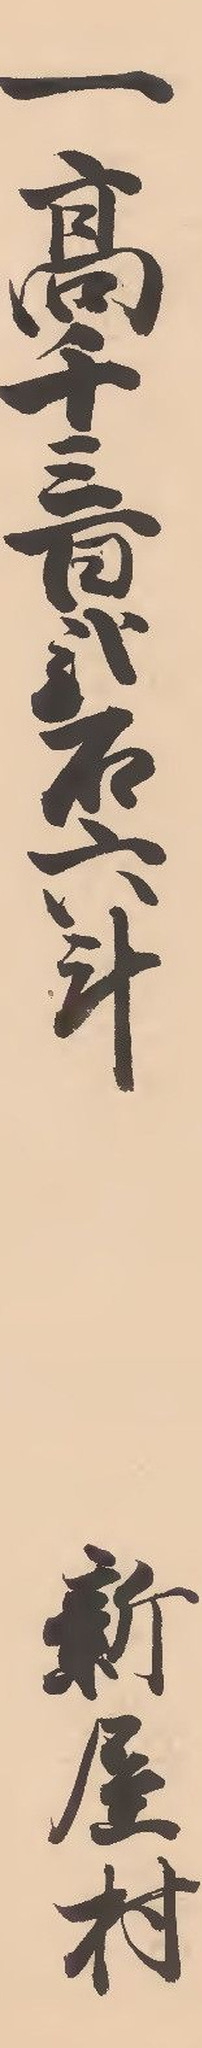一高千三百弐石六斗新屋村
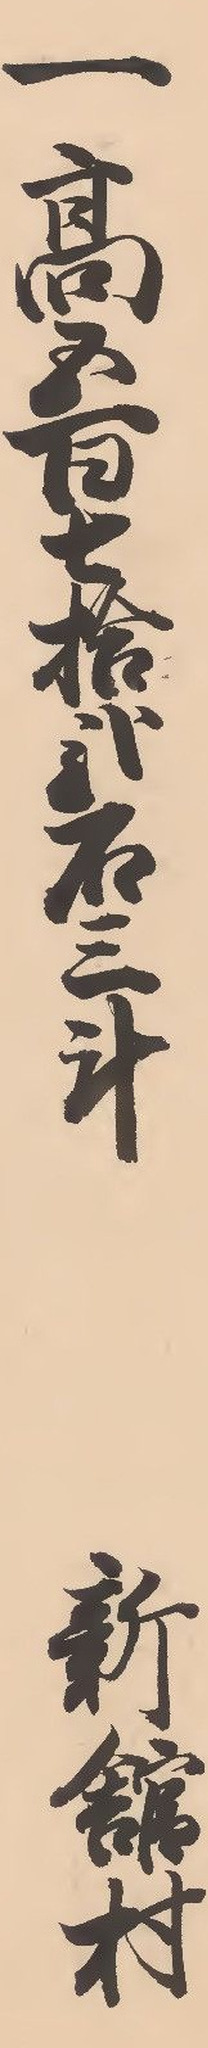一高五百七拾弐石三斗新舘村
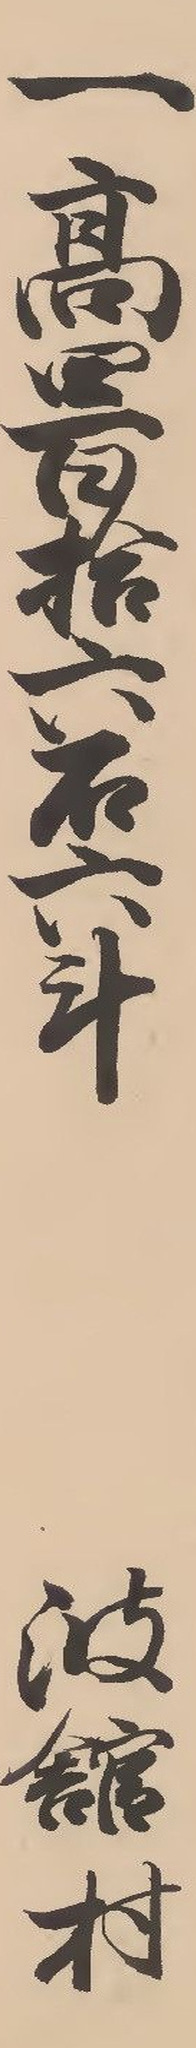一高四百拾六石六斗波舘村
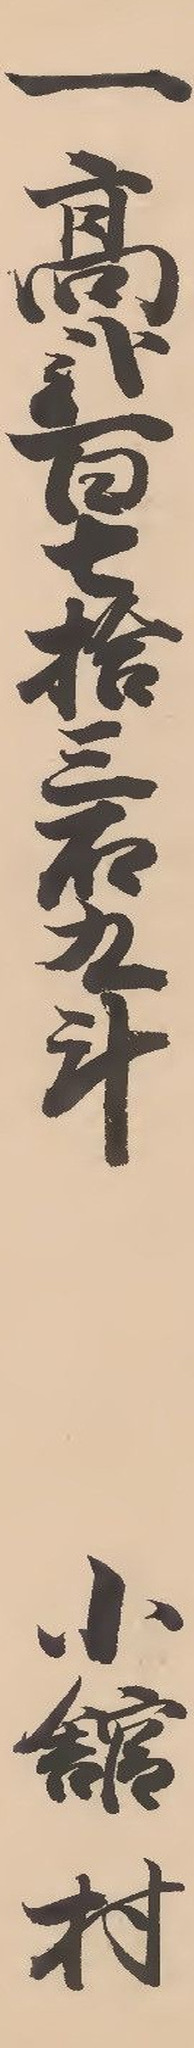一高弐百七拾三石九斗小舘村
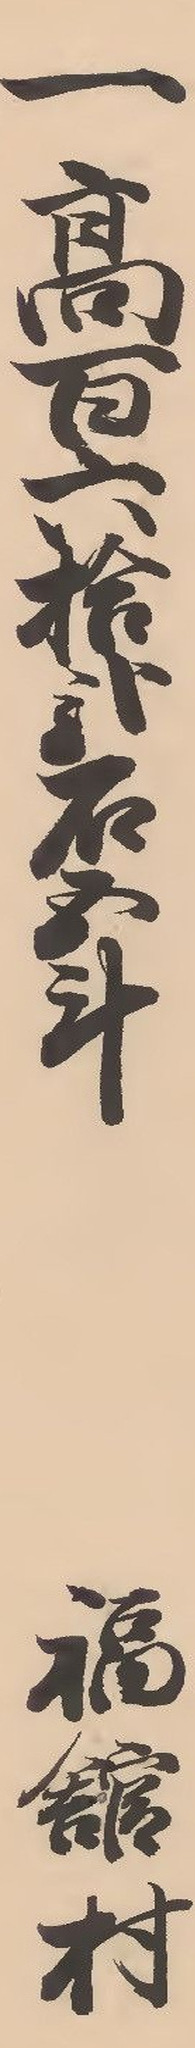一高百六拾弐石五斗福館村

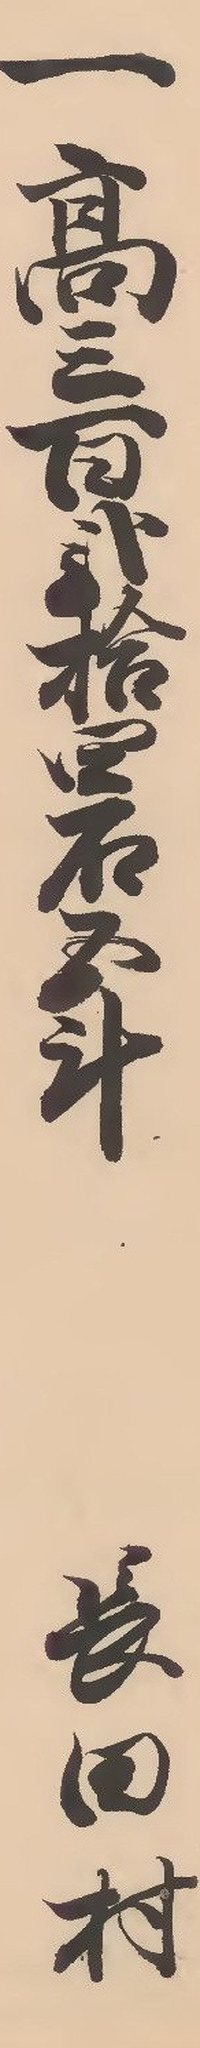一高三百弐拾四石五斗長田村
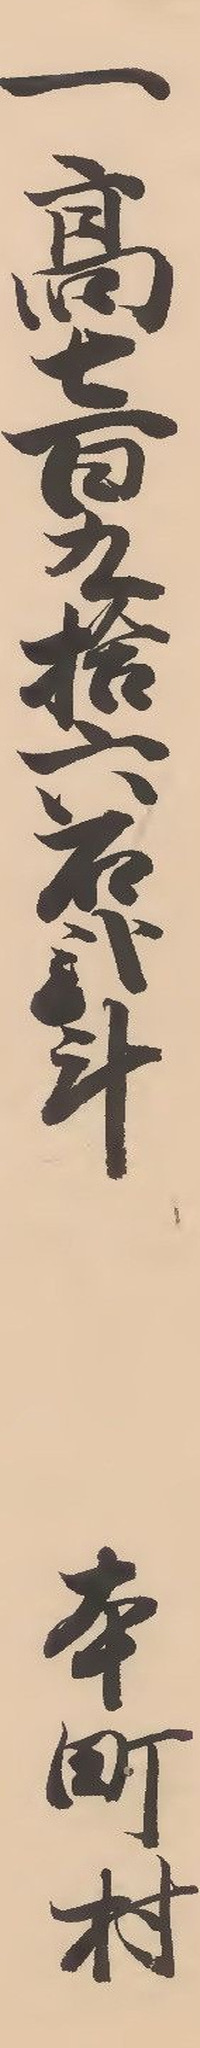一高七百九拾六石弐斗本町村
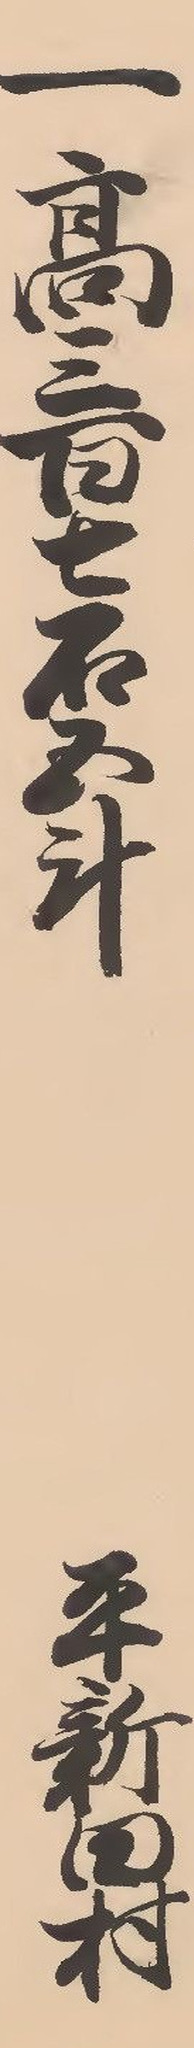一高三百七石五斗平新田村
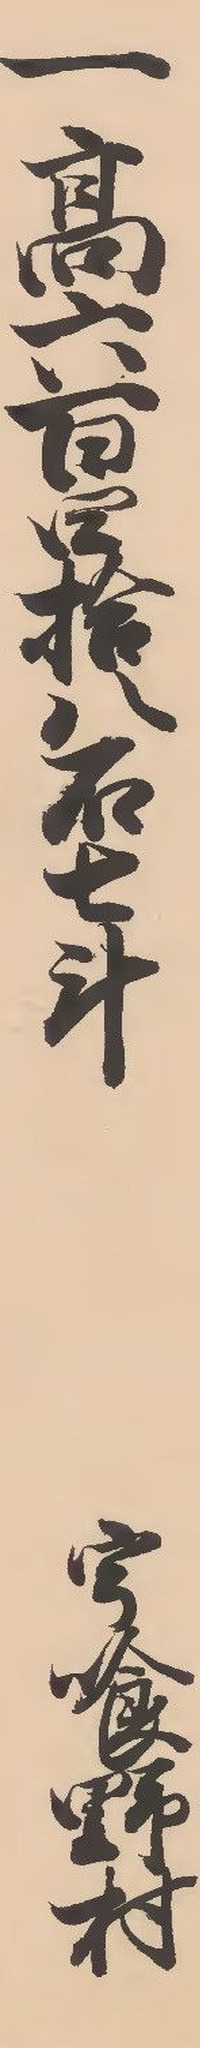一高六百四拾八石七斗宇喰野村
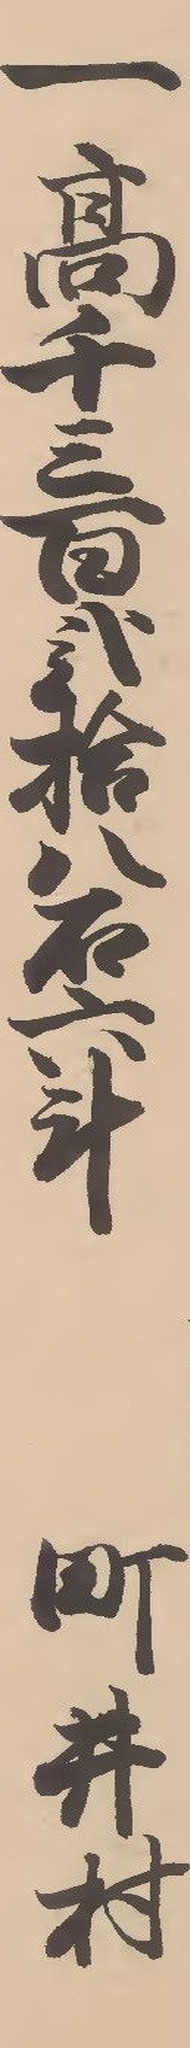一高千三百弐拾八石六斗町井村
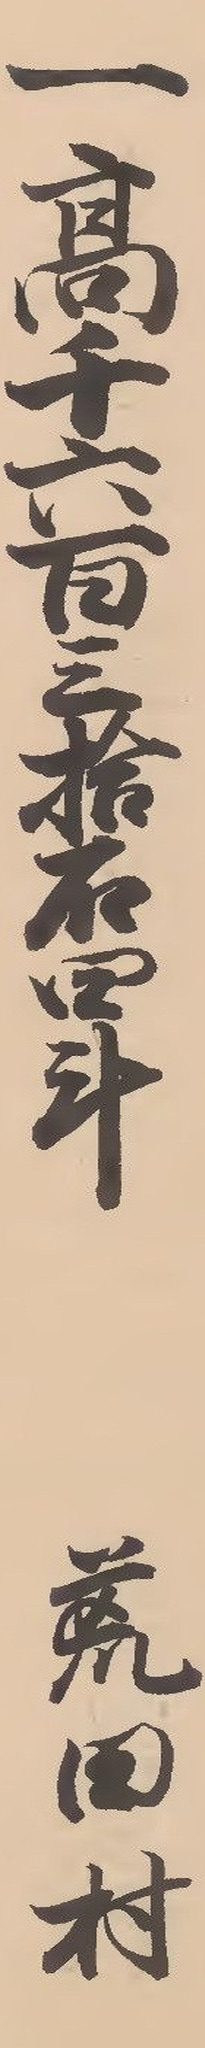一高千六百三拾石四斗荒田村
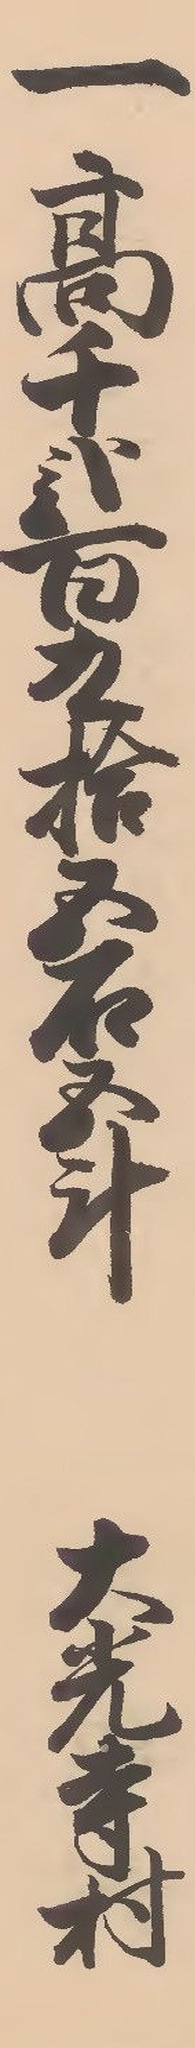一高千弐百九拾五石五斗大光寺村
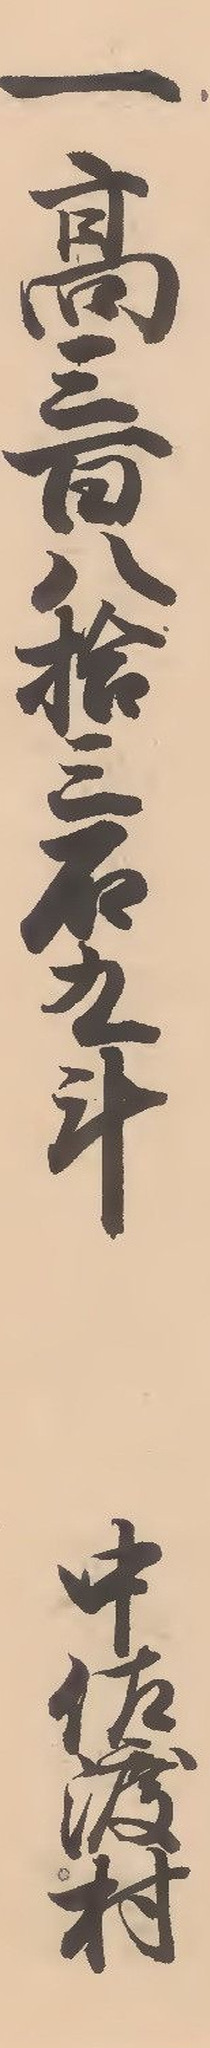一高三百八拾三石九斗中佐渡村

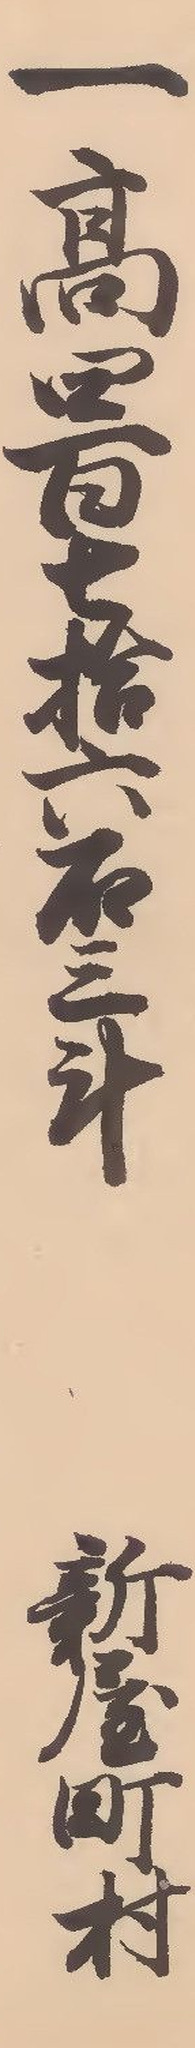一高四百七拾六石三斗新屋町村
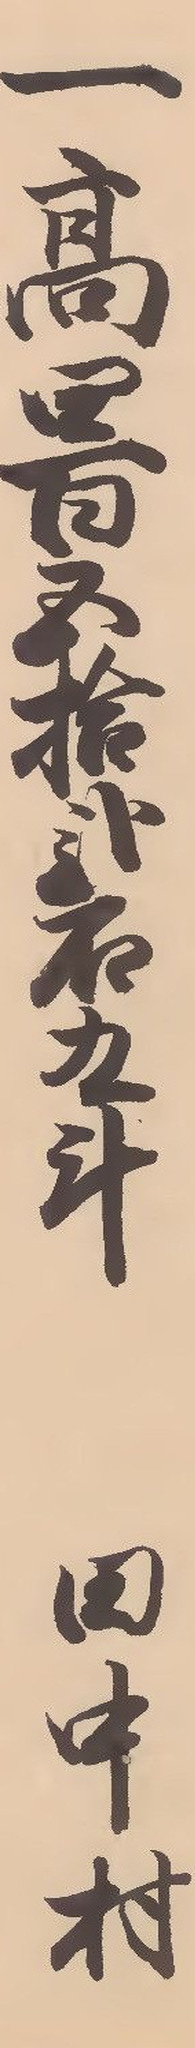一高四百五拾弐石九斗田中村
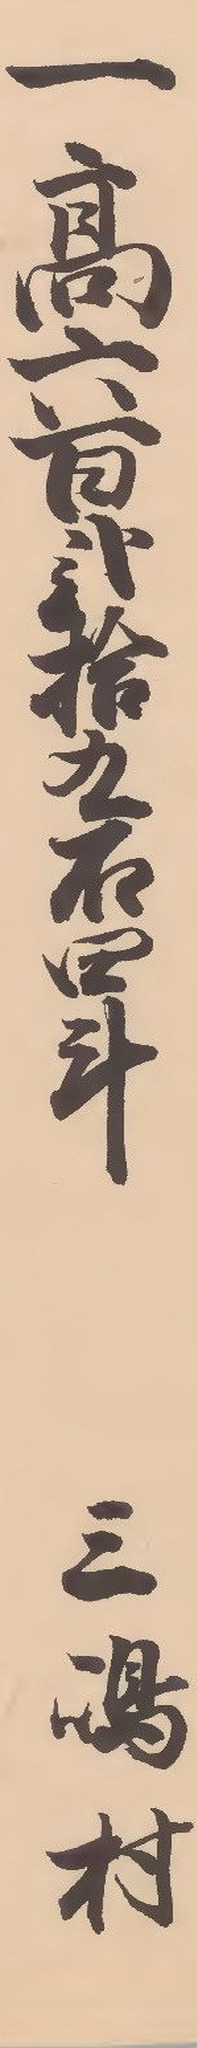一高六百弐拾九石四斗三島村
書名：陸奥国郷帳　７
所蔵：国立公文書館 National Archives of Japan
